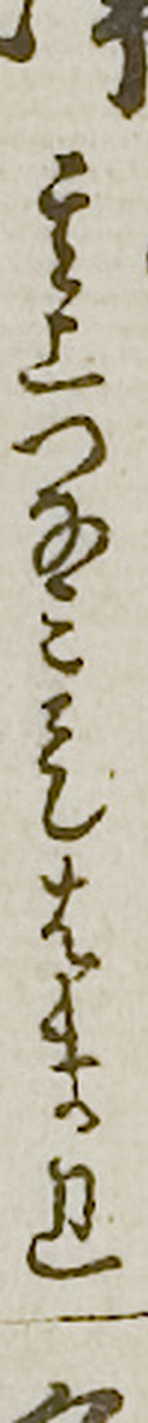其上つなみにてはま辺
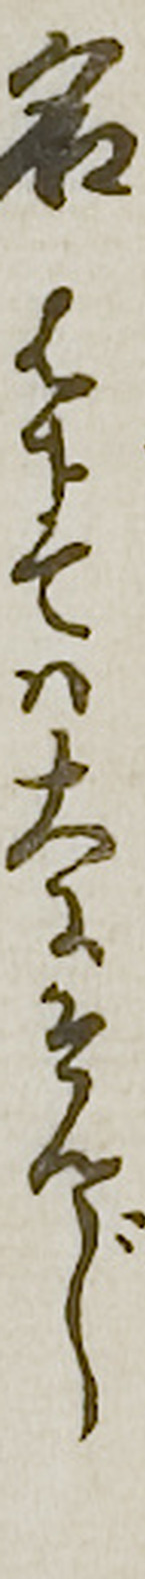はまては大にそんじ
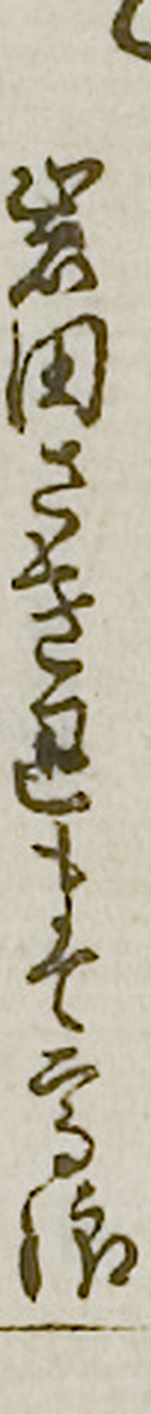岩田さき辺まて高浪
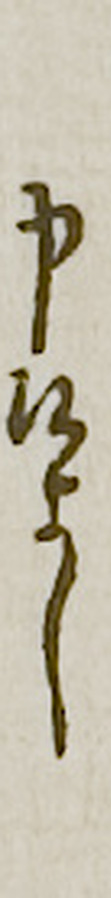申候よし
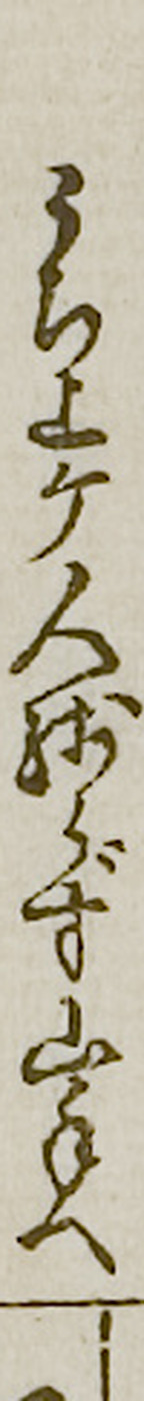うち上ケ人残らず山手へ
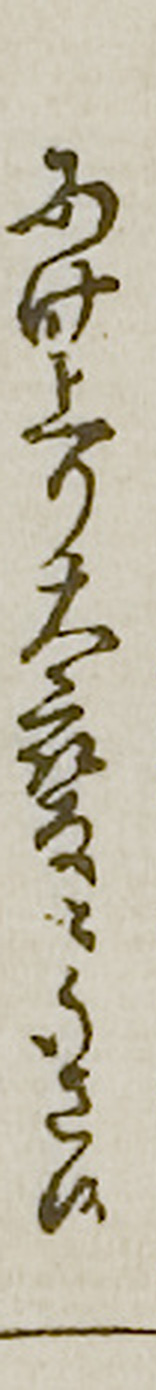にけ上り大変に御さ候
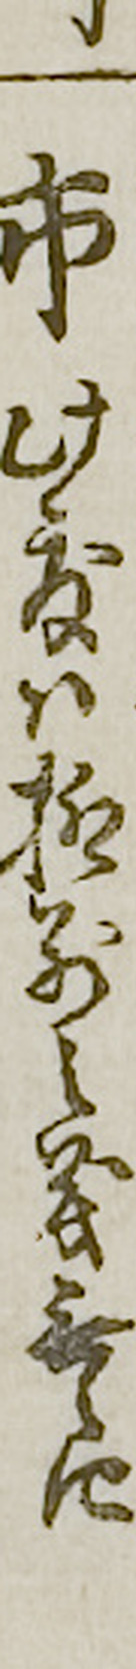此度は格別之義無之由
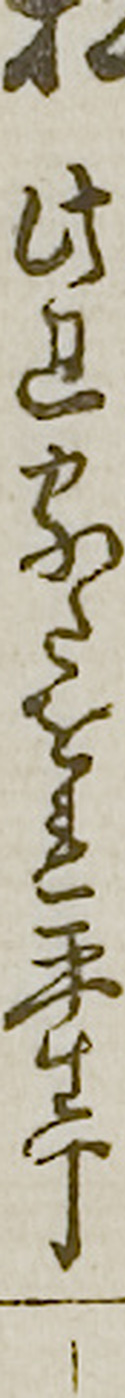此辺家たをれ平生丁
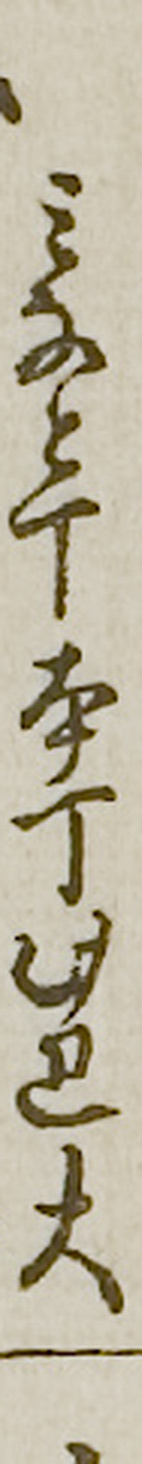みなと丁本丁此辺大
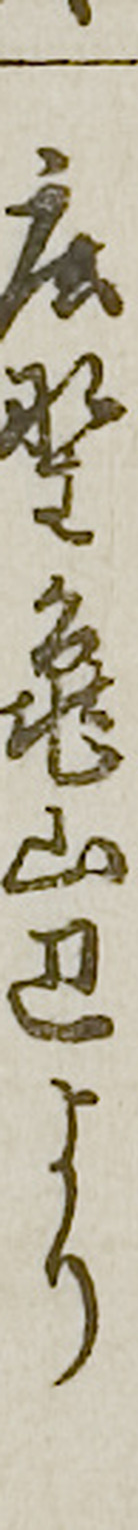庄野亀山辺より
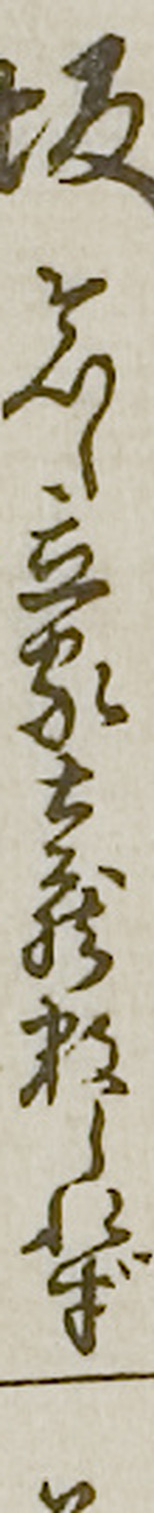そんし立家土蔵数しれず
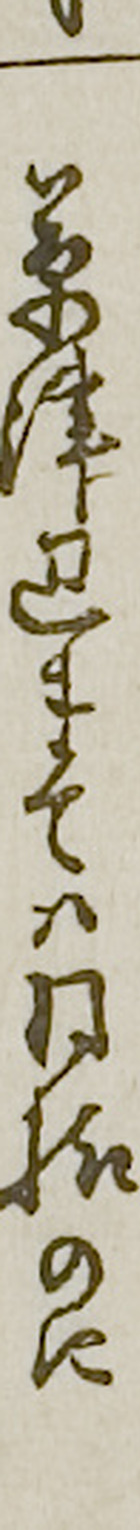草津辺までは同様の由
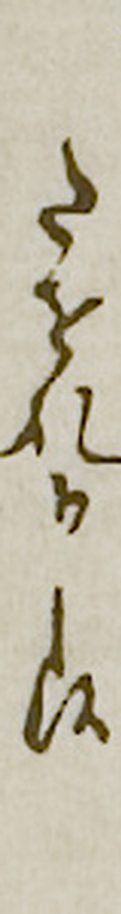たをれ申候
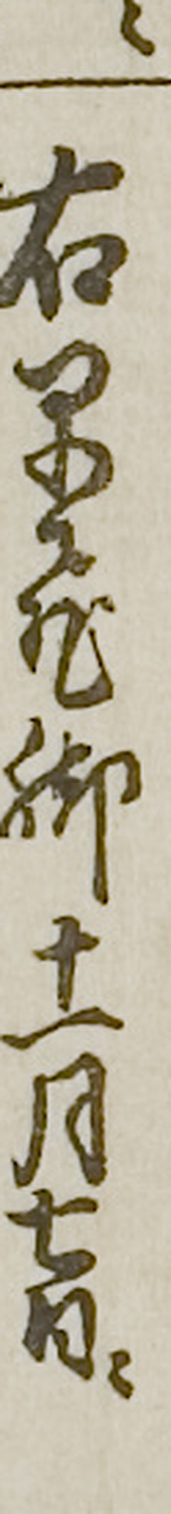右早飛脚十一月七日に
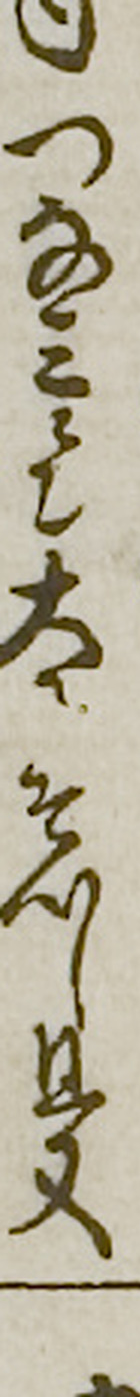つなみにて大にそんし且又
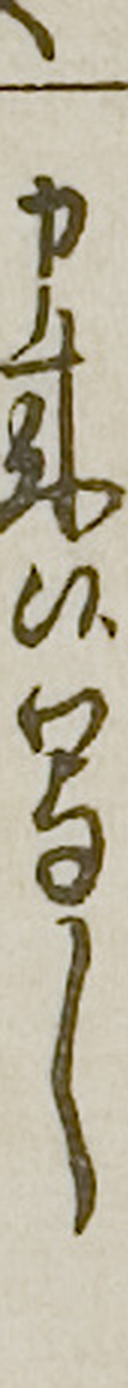申来候写し
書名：大坂辺東海道本しらべ大地震津波図
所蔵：東京大学総合図書館 General Library in the University of Tokyo, JAPAN
